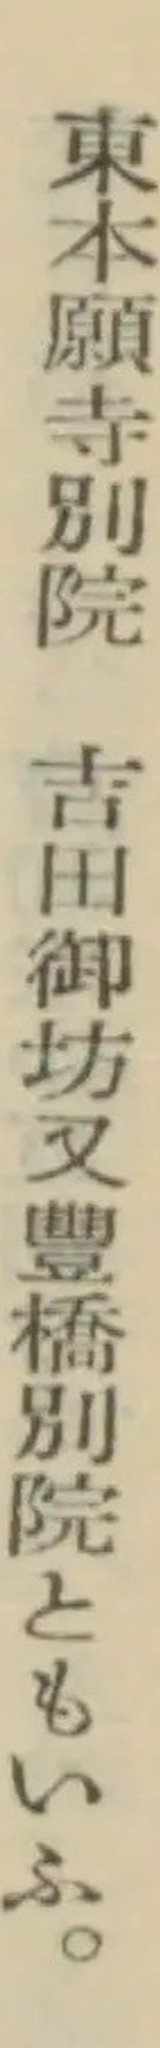東本願寺別院吉田御坊又豊橋別院ともいふ。
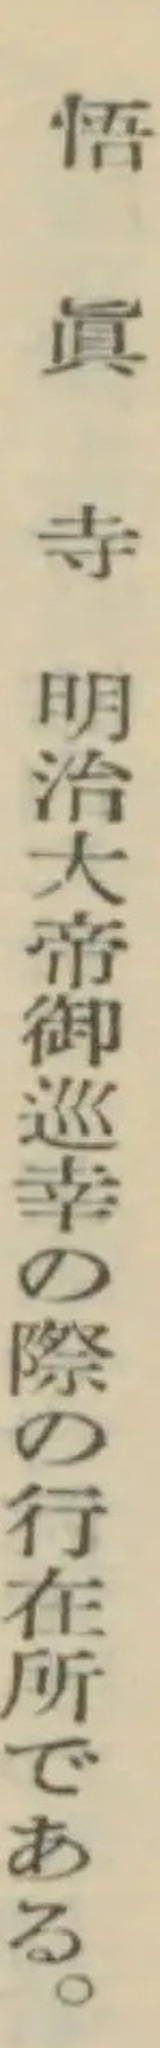悟真寺明治大帝御巡幸の際の行在所である。
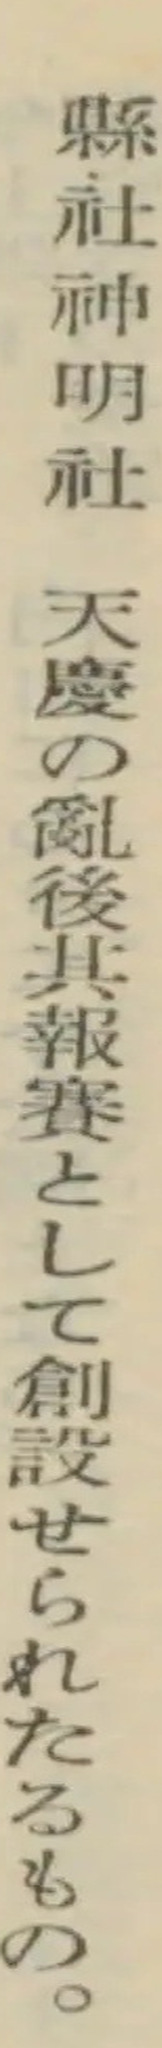県社神明社天慶の乱後其報賽として創建せられたるもの。
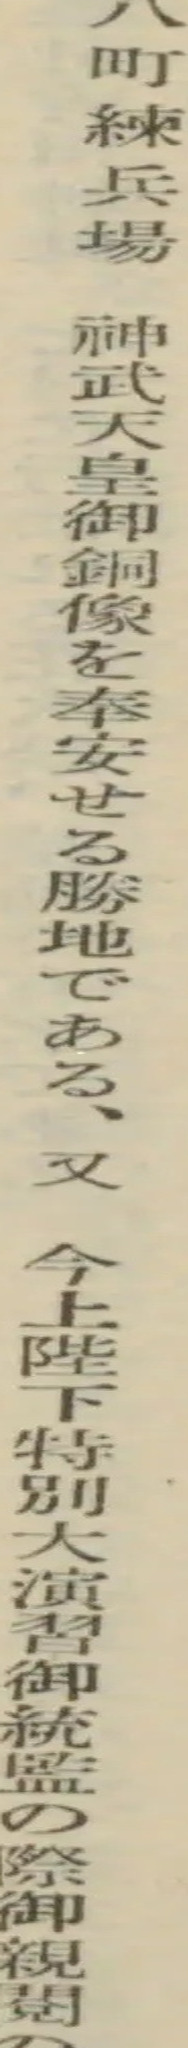八町練兵場神武天皇御銅像を奉安せる勝地である、又今上陛下特別大演習御統監の際御親閲の聖
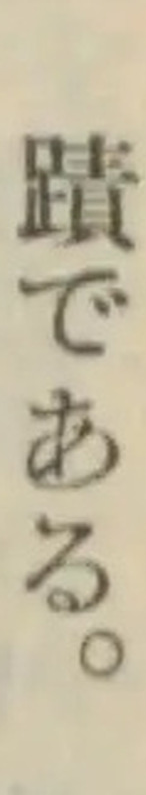蹟である。
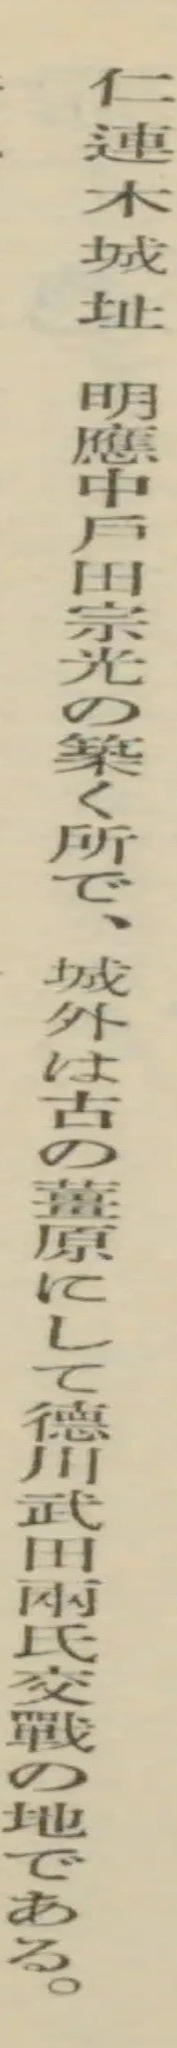仁連木城址明応中戸田宗光の築く所で、城外は古の薑原にして徳川武田両氏交戦の地である。
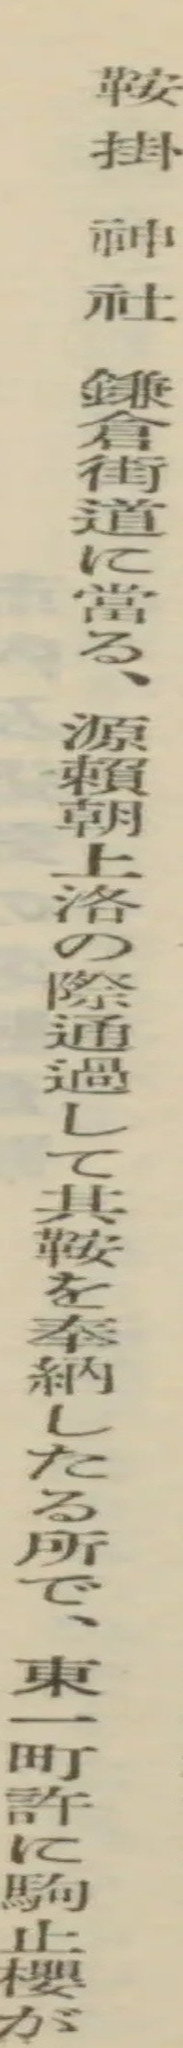鞍掛神社鎌倉街道に当る、源頼朝上洛の際通過して其鞍を奉納したる所で、東一町許に駒止桜が
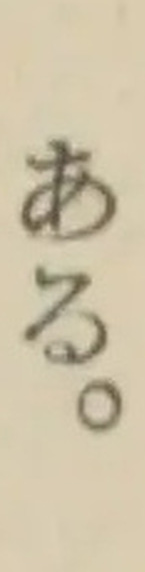ある。
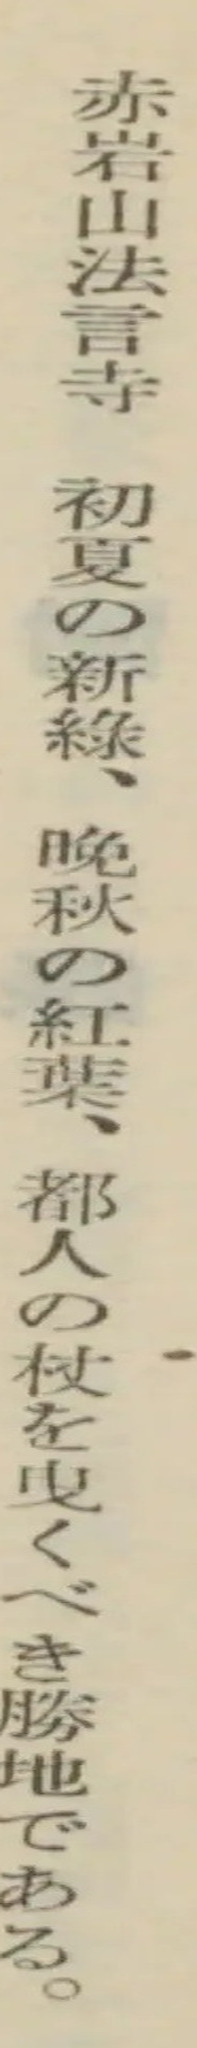赤岩山法言寺初夏の新緑、晩秋の紅葉、都人の杖を曳くべき勝地である。
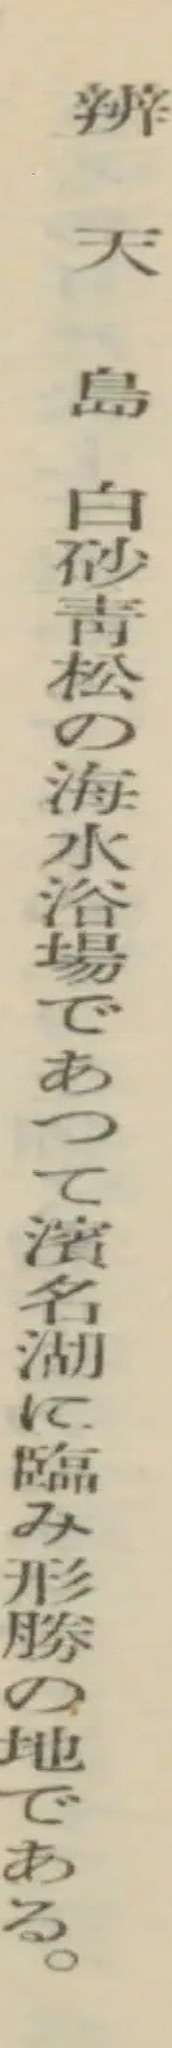弁天島白砂青松の海水浴場であつて浜名湖に臨み形勝の地である。
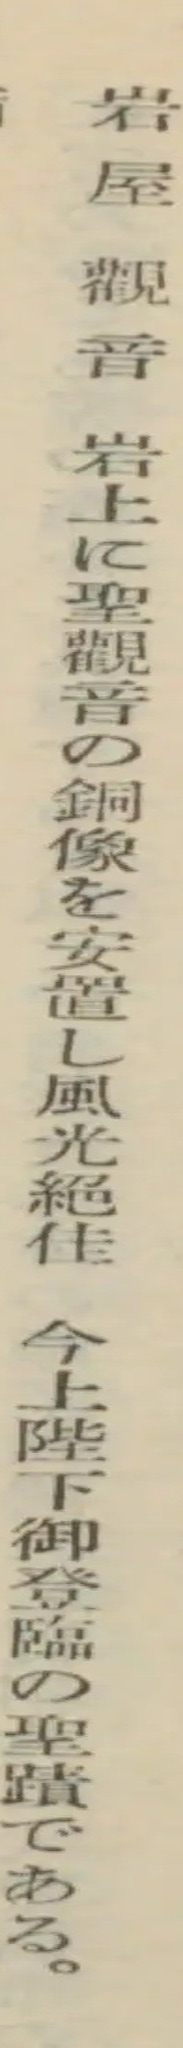岩屋観音岩上に聖観音の銅像を安置し風光絶佳今上天皇御登臨の聖蹟である。
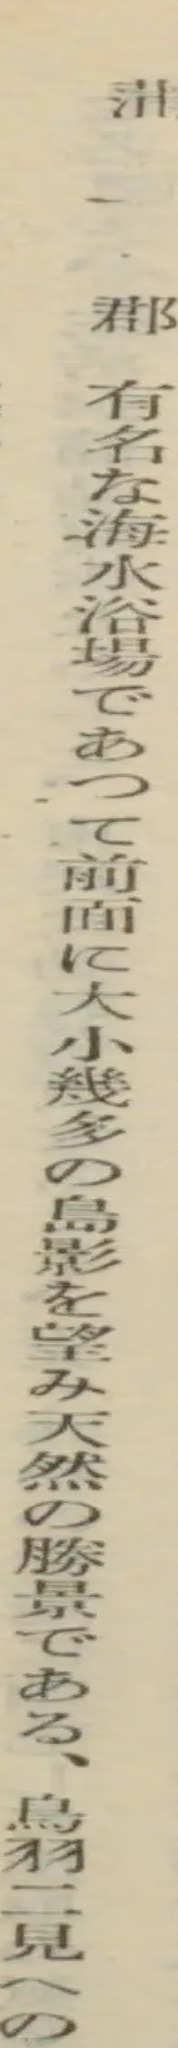蒲郡有名な海水浴場であつて前面に大小幾多の島影を望み天然の勝景である、鳥羽二見への
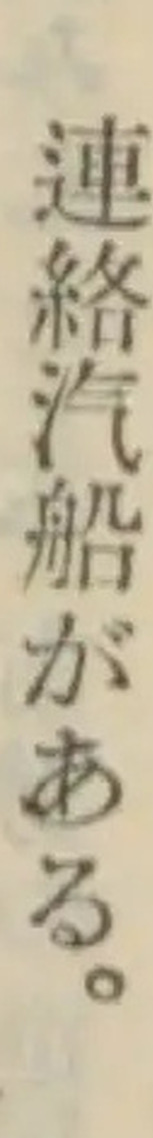連絡汽船がある。
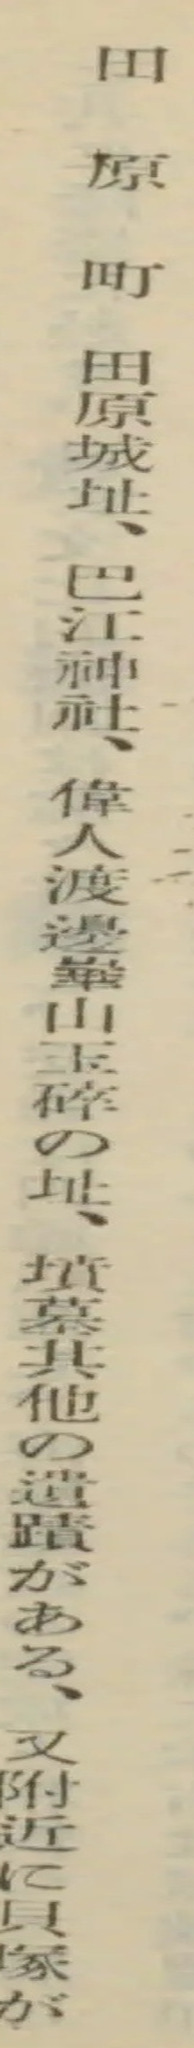田原町田原城址、巴江神社、偉人渡邊崋山玉砕の址、墳墓其他の遺蹟がある、又附近に貝塚が
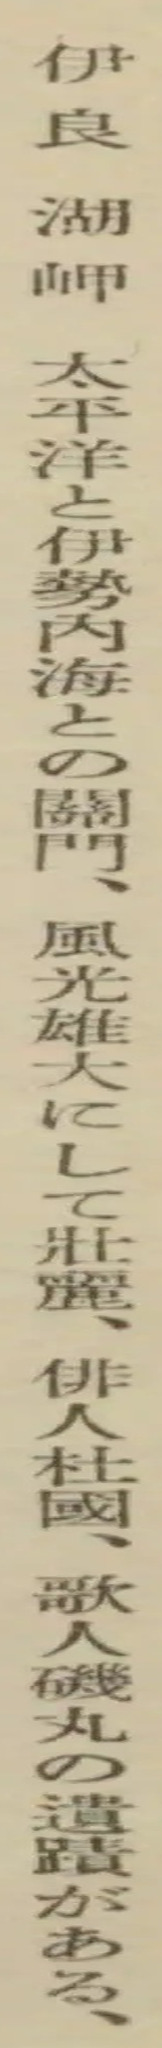伊良湖岬太平洋と伊勢内海との関門、風光雄大にして壮麗、俳人杜国、歌人磯丸の遺蹟がある、
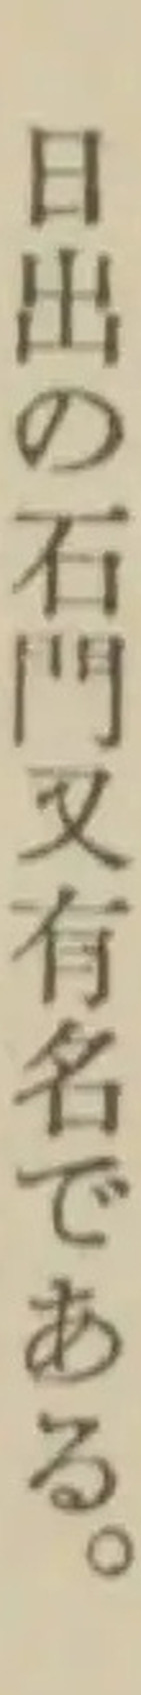日出の石門又有名である。
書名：産業の豊橋
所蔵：国立国会図書館 National Diet Library, JAPAN
